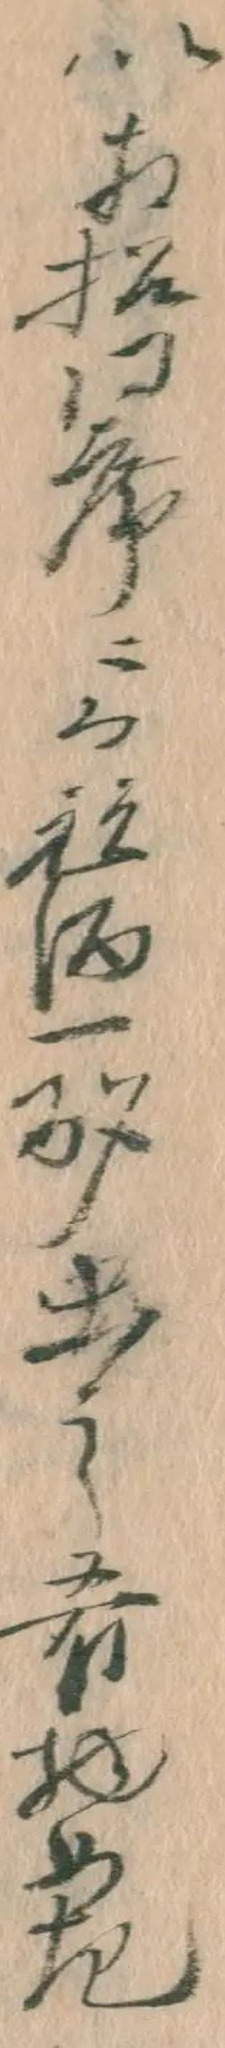以相招同席ニ而祝酒一酌出之肴物如左
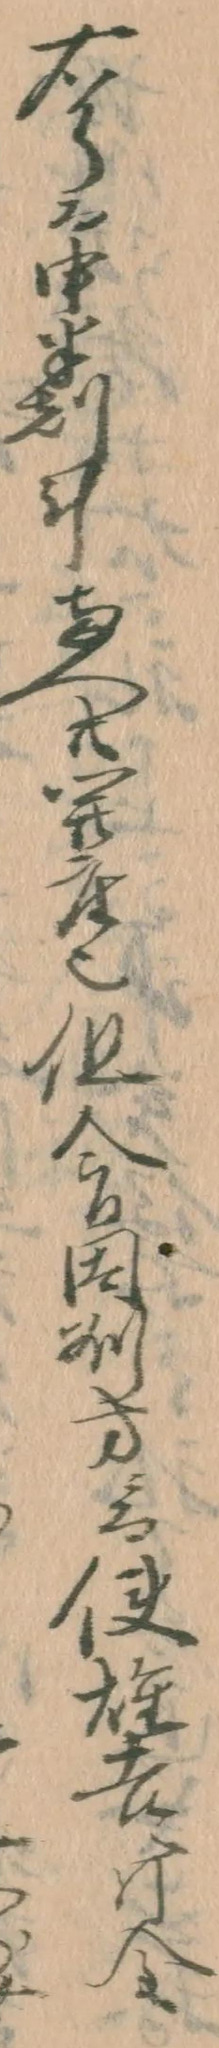右了而申半刻斗両人共開座也但今日因州方ニ而使雄吉へ引金
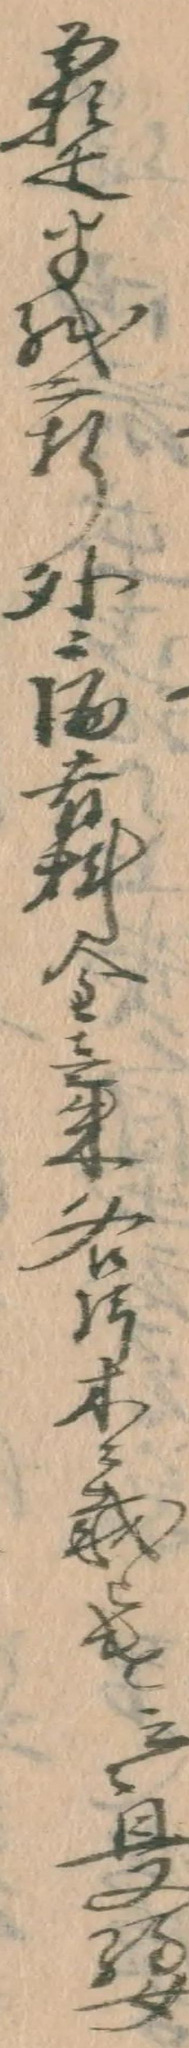五拾疋半紙二折外ニ酒肴料金壱朱各片木ニ載被遣云〻且又嫁女
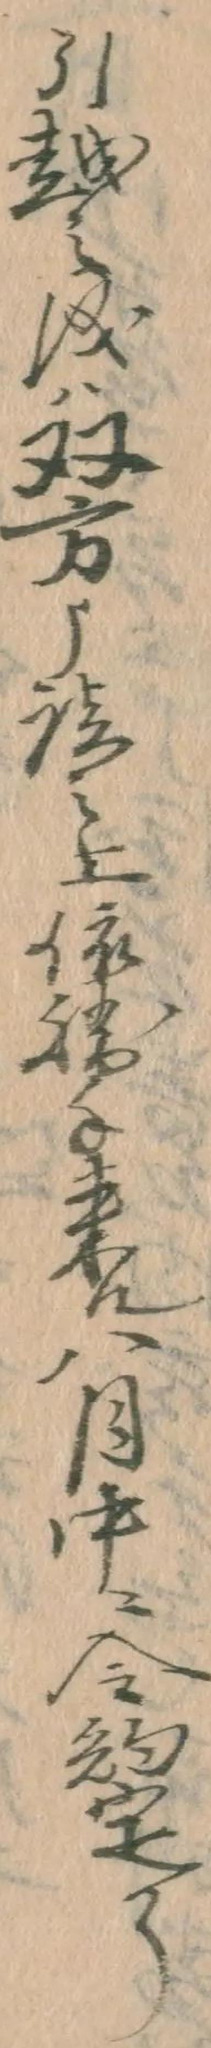引越之儀ハ双方申談之上依勝手来ル八月中ニ令約定了
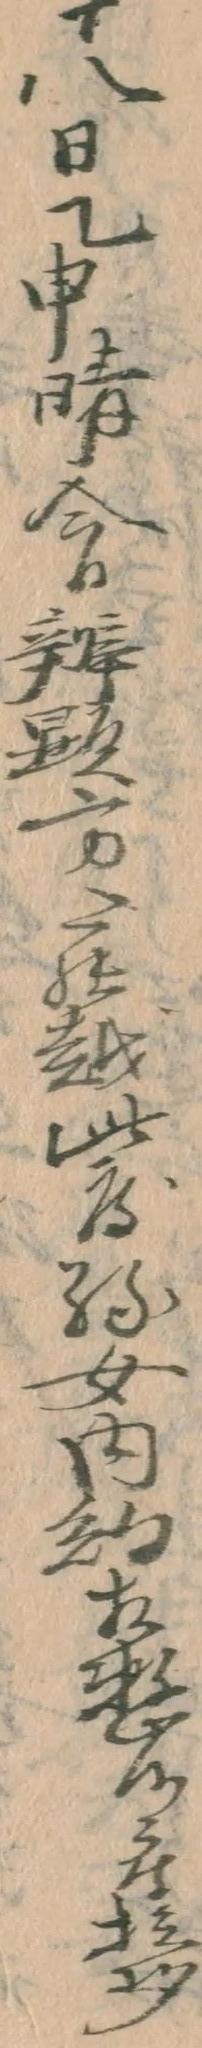十八日乙申晴今日辨顕方へ罷越此度嫁女内約相整候ニ付挨拶
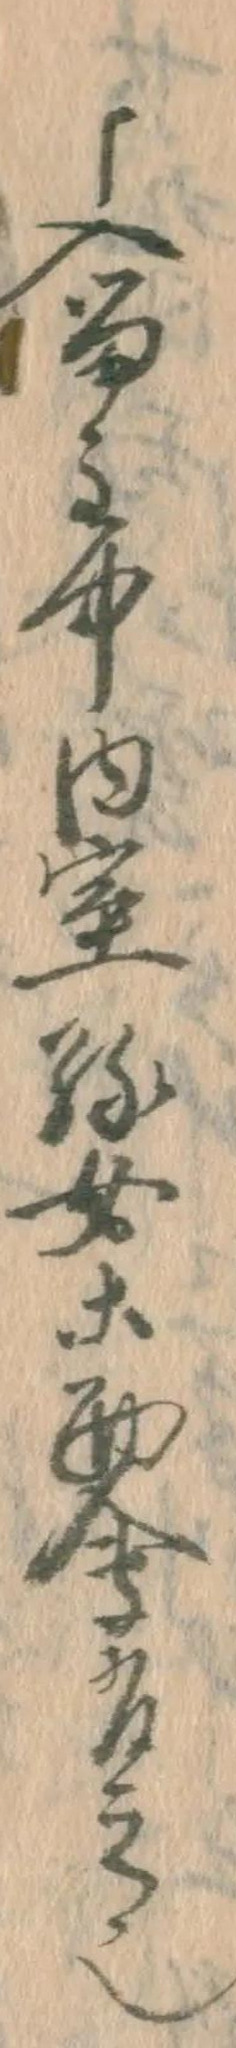申入留主中内室嫁女等面會有之也
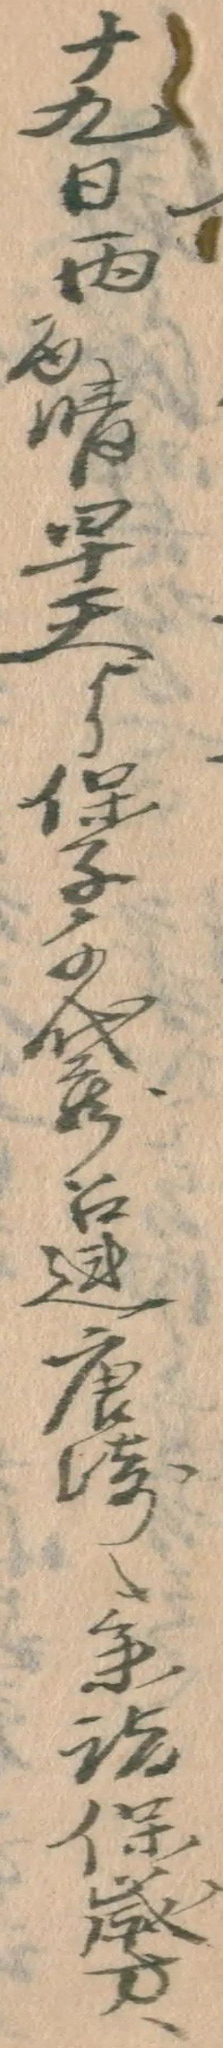十九日丙酉晴早天より保子千代蔵召連唐崎へ参詣保歳方へ
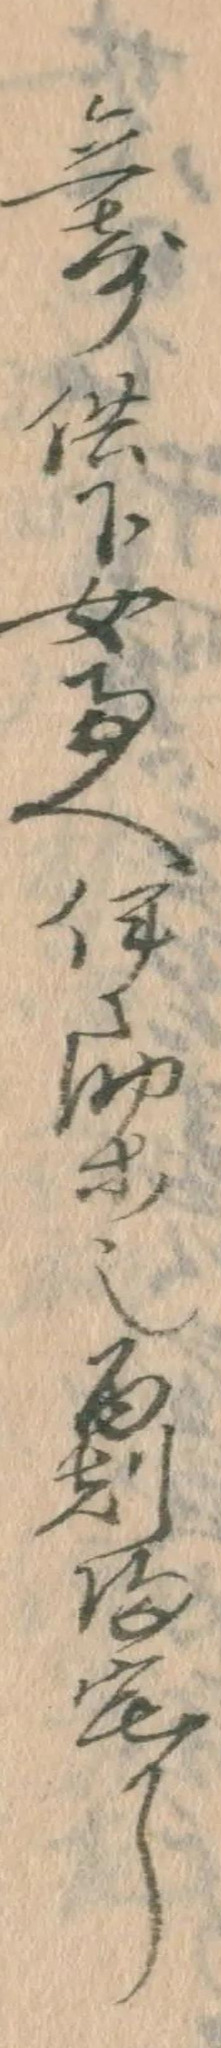立寄供下女両人伊之助等也酉刻帰宅了
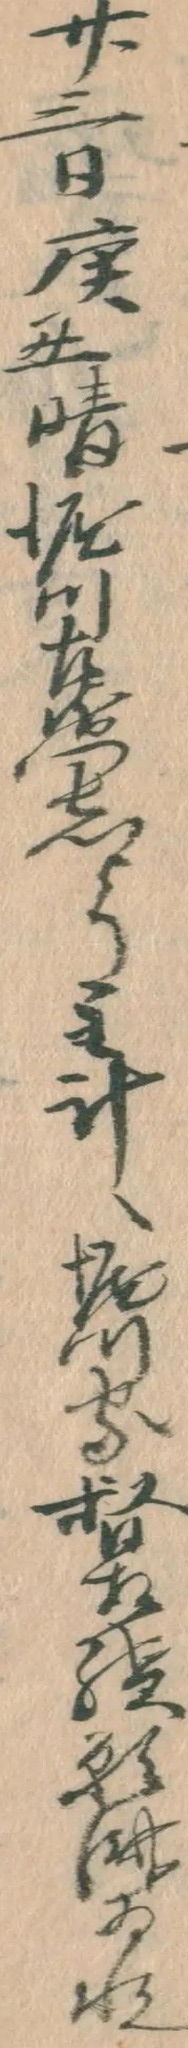廿三日庚丑晴堀川左衛門志より主計へ堀川家督相續願済為祝
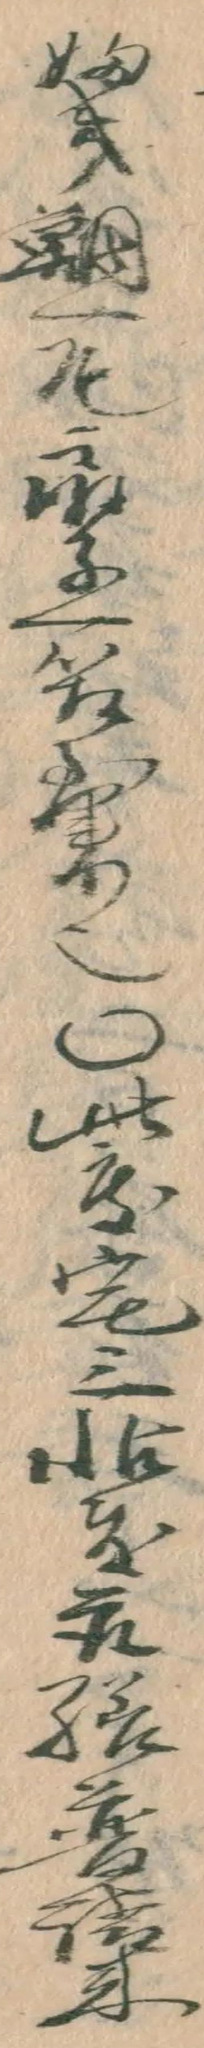ふき鯛一尾扇子一箱到来也○此度宅三帖敷取膳普請来
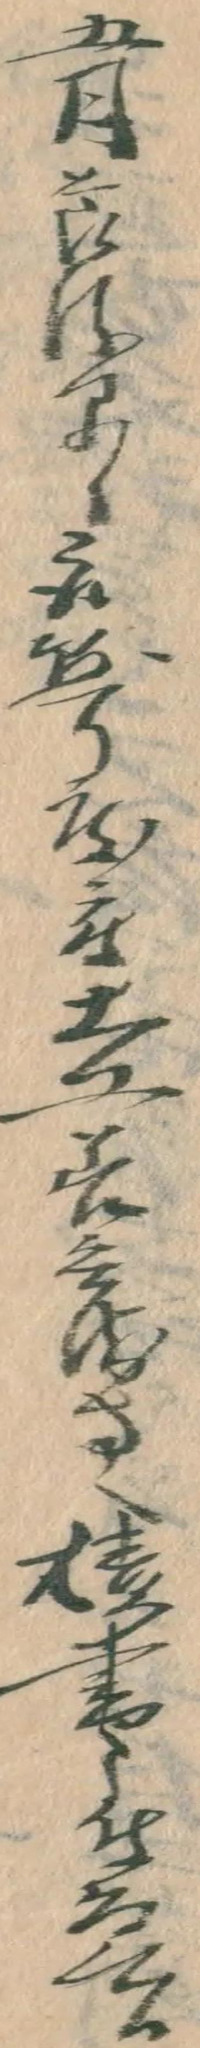五月節後早々取懸り度ニ付大工善兵衛方へ積書申付尚今日
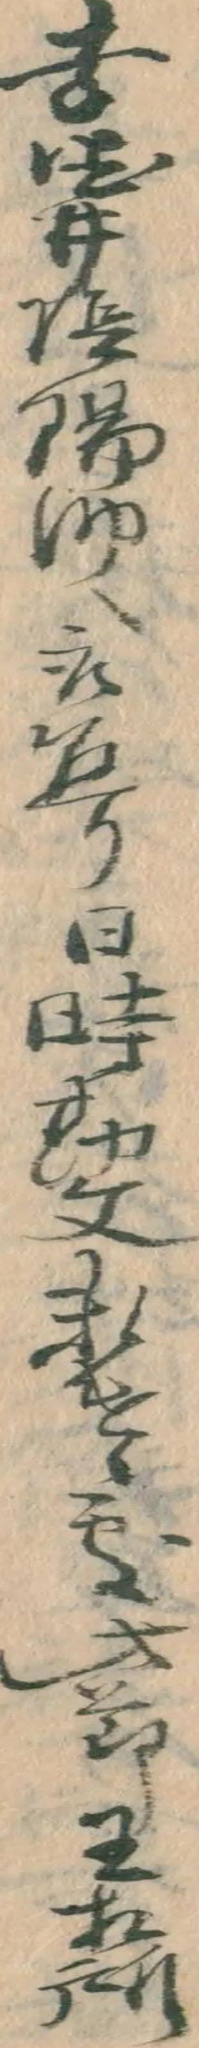幸徳井陰陽助へ取懸り日時勘文に頼遣候處此節王相所
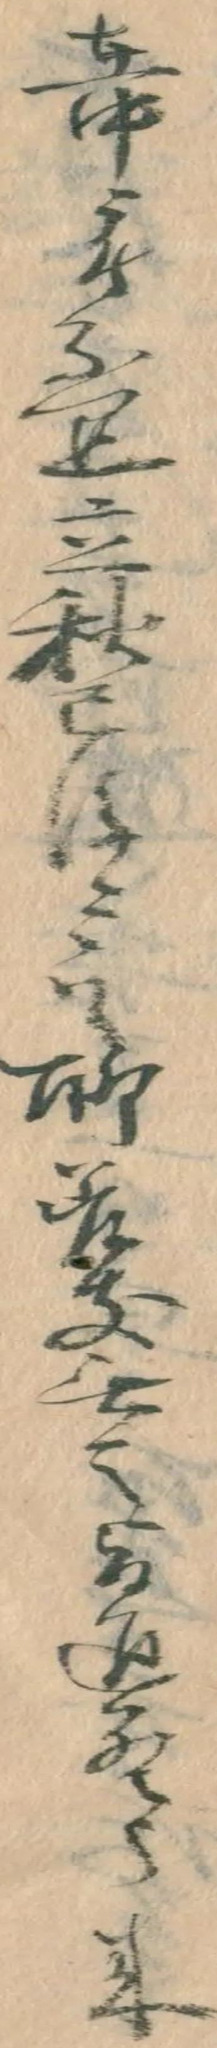在中二付不宜立秋已後候ハゝ聊差支無之旨返事申来

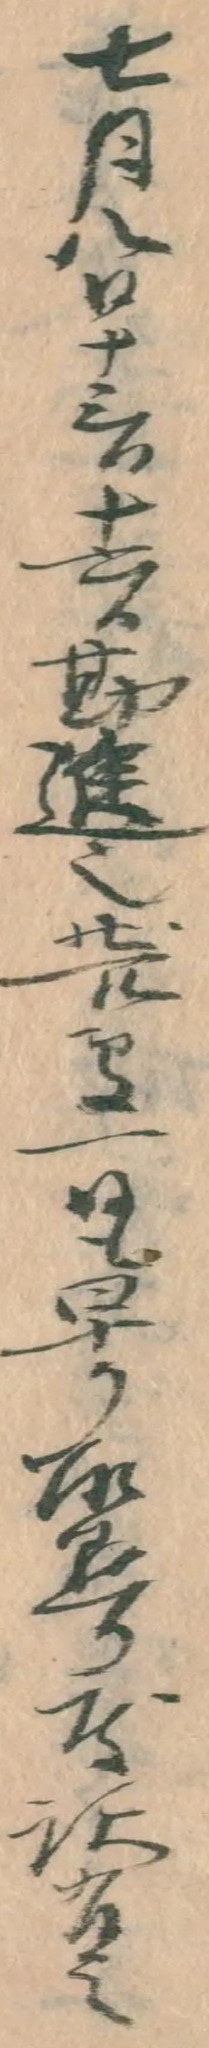七月八日十三日十六日勘進也然ル處一日も早ク取懸り度訴有之
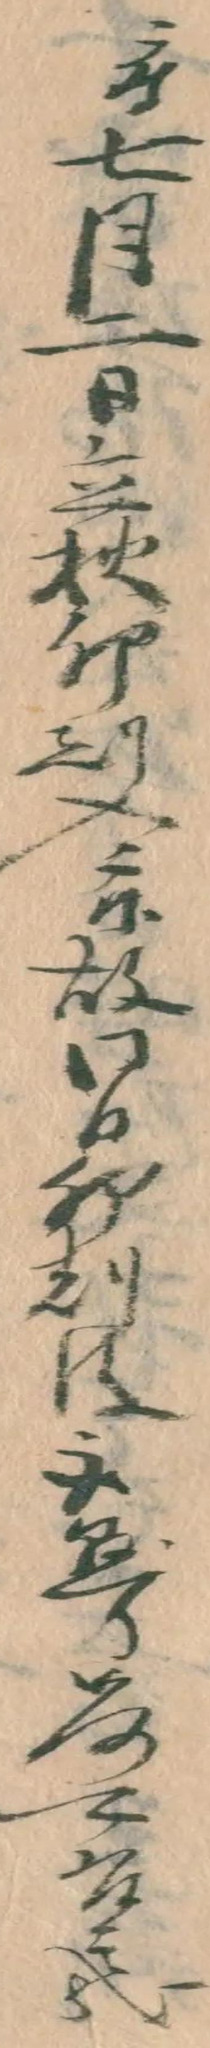ニ付七月二日立秋卯刻入ニ候故同日卯刻後取懸り如何可有之哉
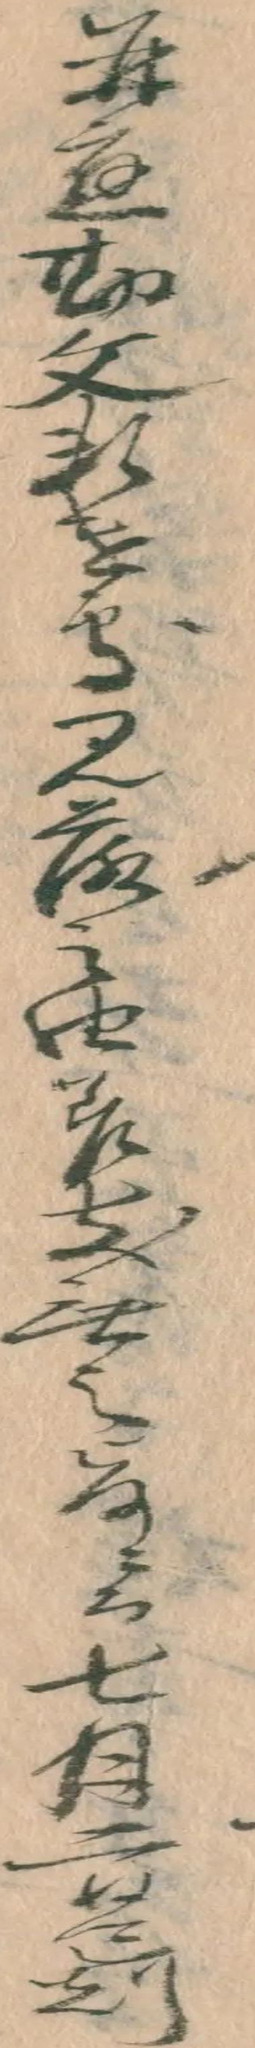并應勘文頼遣處見落之由差支無之旨ニ而七月二日巳刻
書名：賀茂社記録. 第69冊
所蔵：国立国会図書館 National Diet Library, JAPAN
